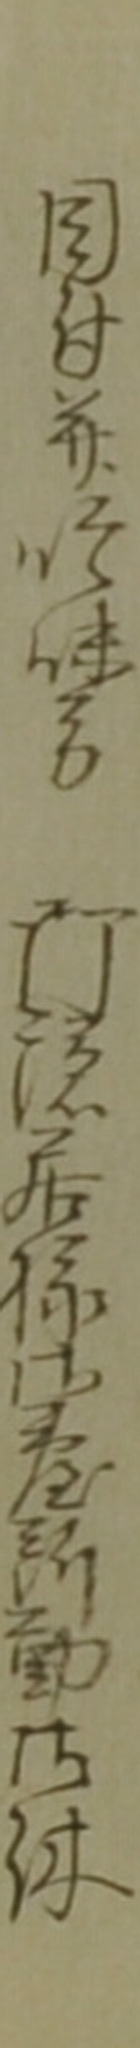目付并吟味方御隠居様御台所勤御休
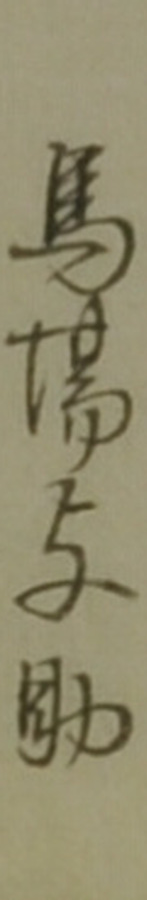馬場与助

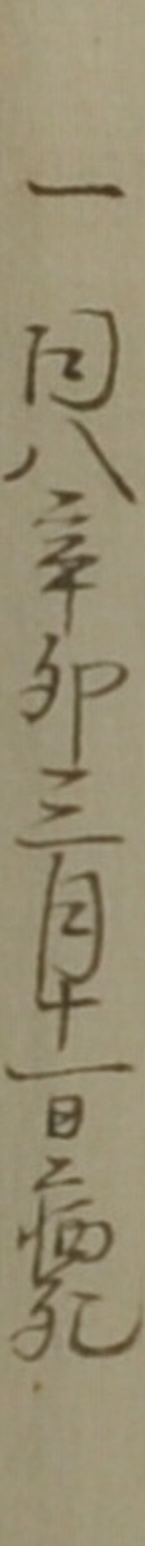一同八辛卯三月十一日病死
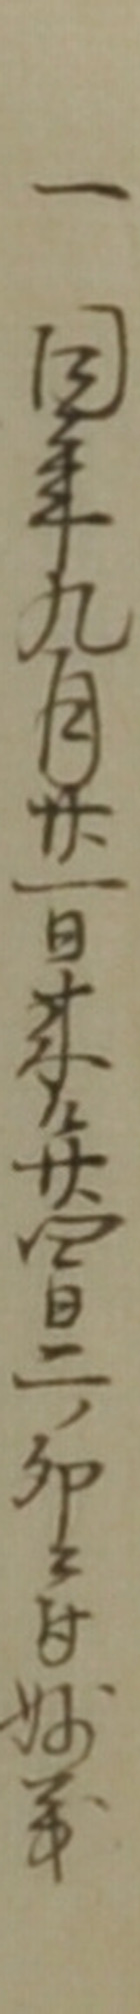一同年九月廿一日来廿四日二卯付妙義
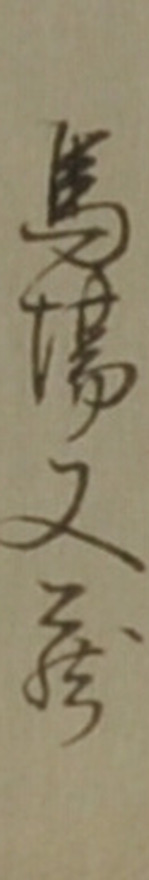馬場又蔵
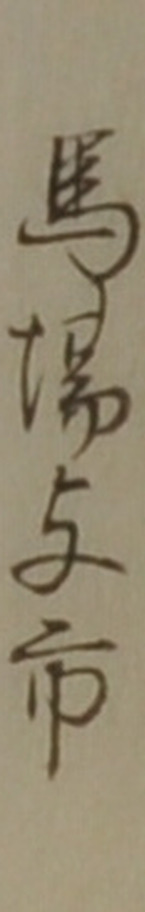馬場与市
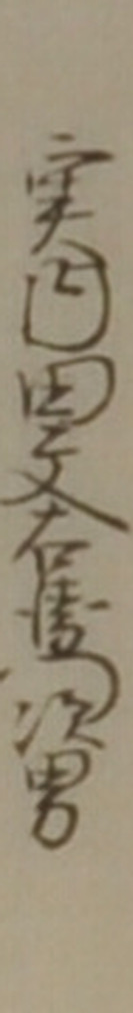実内田文右衛門次男
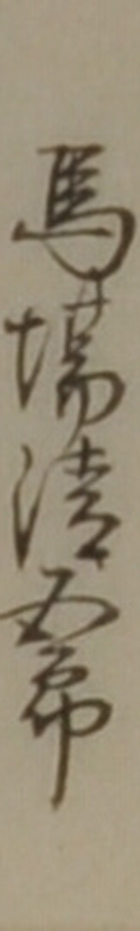馬場清五郎
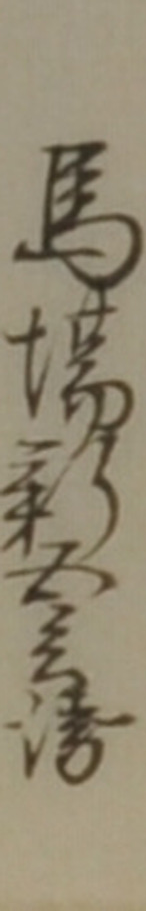馬場新五兵衛
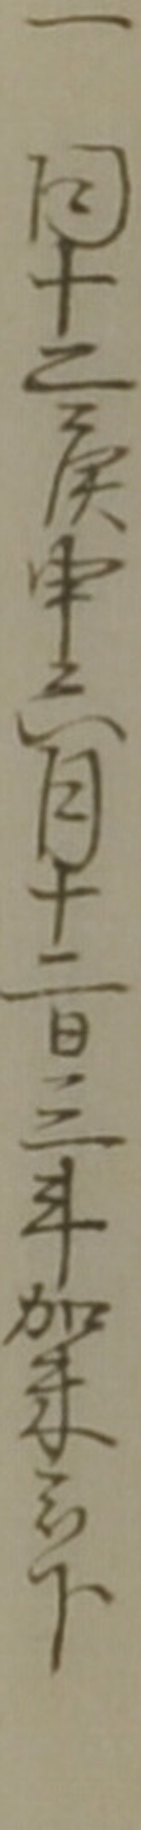一同十二庚申六月十二日三斗加米被下
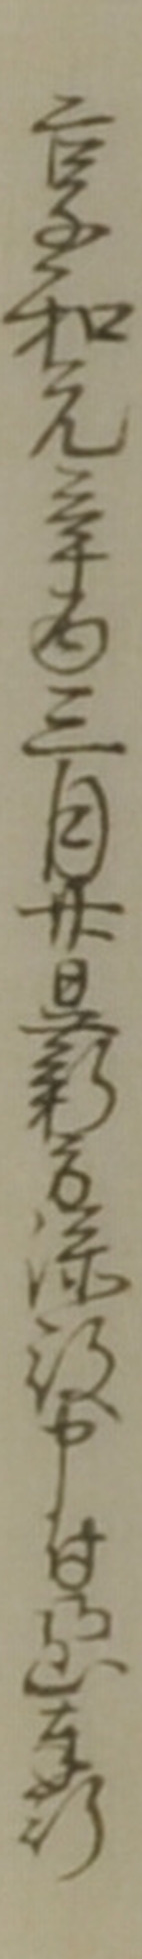一享和元辛酉三月廿日薪方添役申付御山奉行

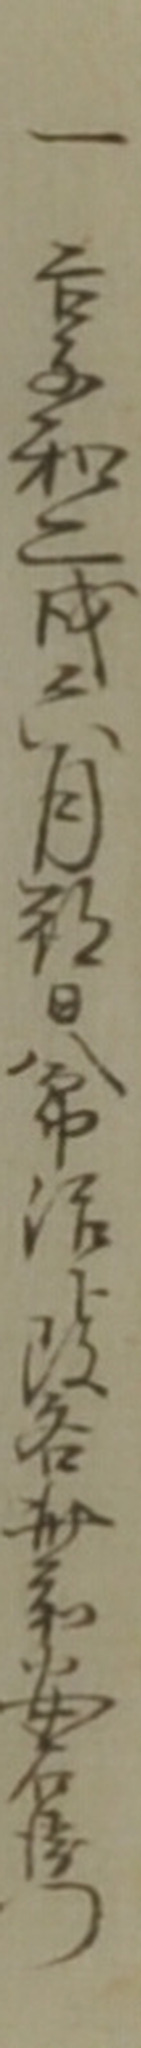一享和二戌六月朔日八郎治改名此前安右衛門
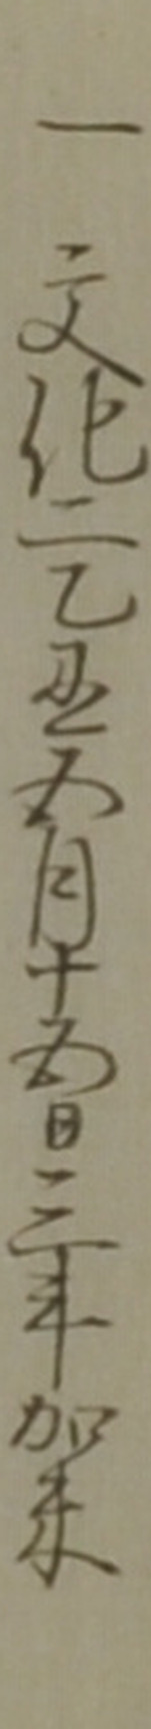一文化二乙丑五月十五日三斗加米
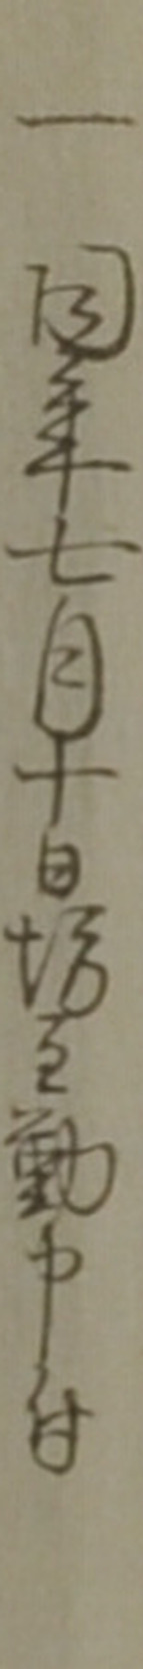一同年七月十日坊主勤申付
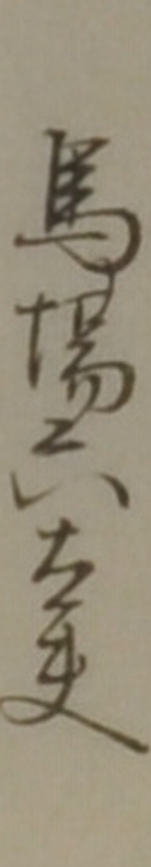馬場六太夫
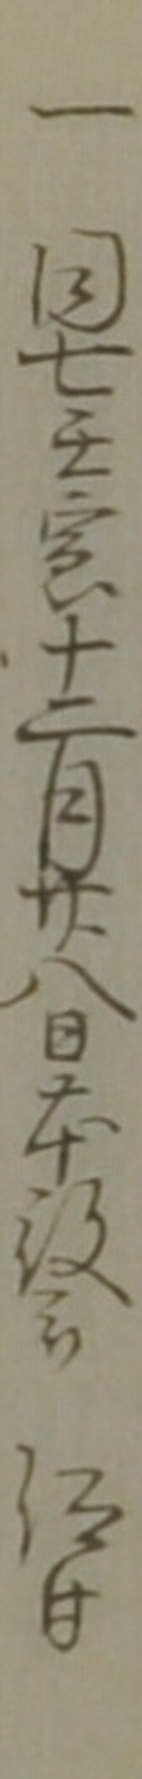一同七壬寅十二月廿八日本役被仰付
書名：無足廃家（弐）
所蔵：伊那市立高遠町図書館・合同会社AMANE
